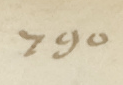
790
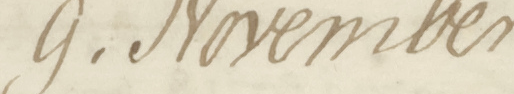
9. November.
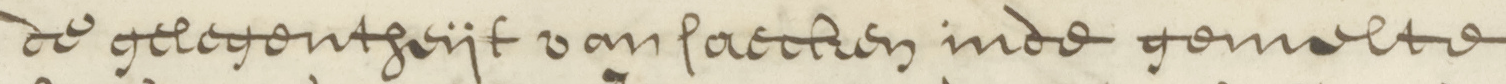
de gelegentheijt van saecken inde gemelte —
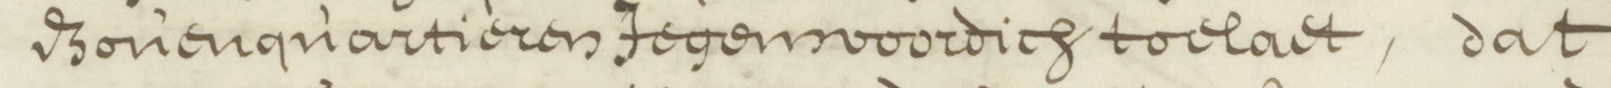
Bouenquartieren Jegenwoordich toelaet, dat
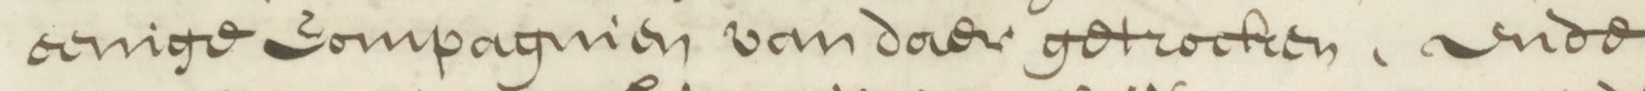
eenige Compagnien van daer getrocken, ende
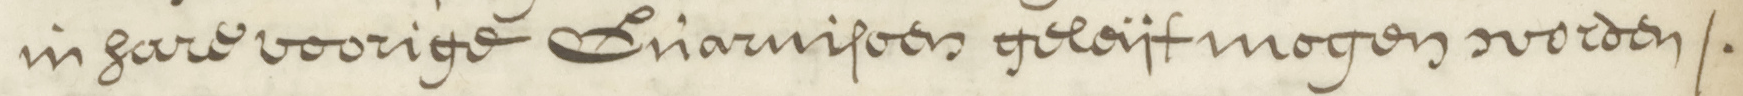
in hare voorige Guarnisoen geleijt mogen worden.
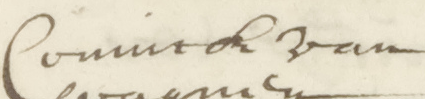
Coninck van
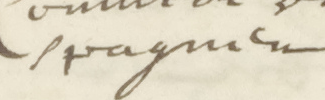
Spagnen
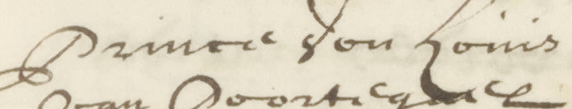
Prince don Louis
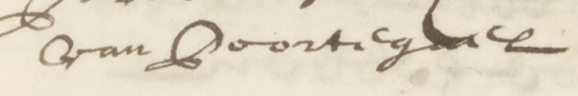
van Poortegael
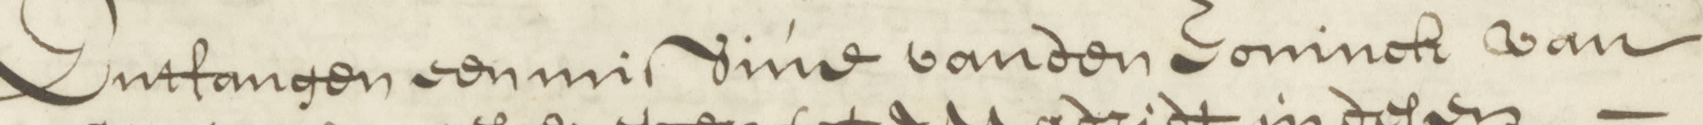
Ontfangen een missiue vanden Coninck van
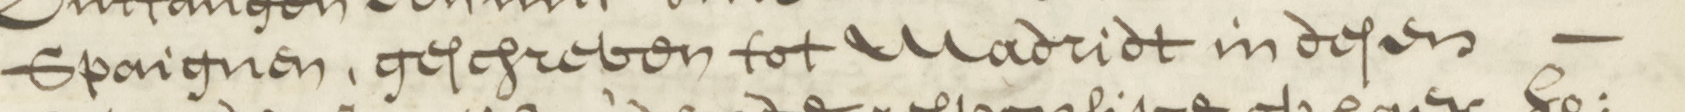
Spaignen, geschreven tot Madridt in desen —
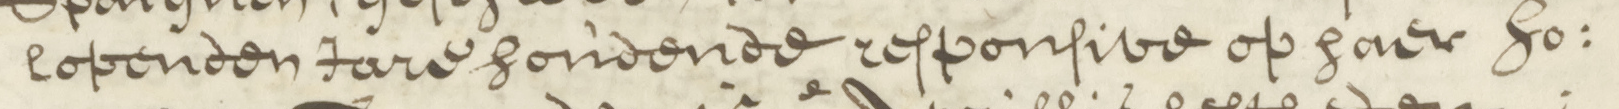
lopenden Jare houdende responsive op haer ho:
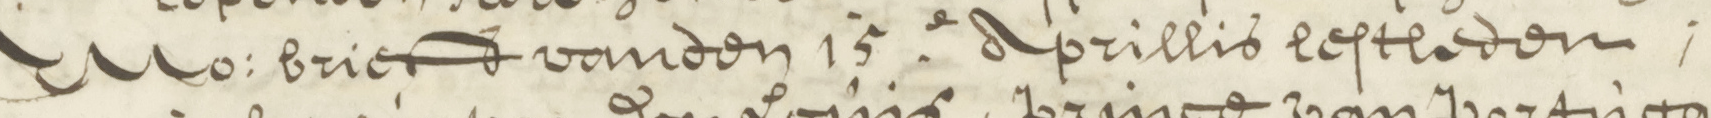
Mo: brieff vanden 15e. Aprillis lestleden;
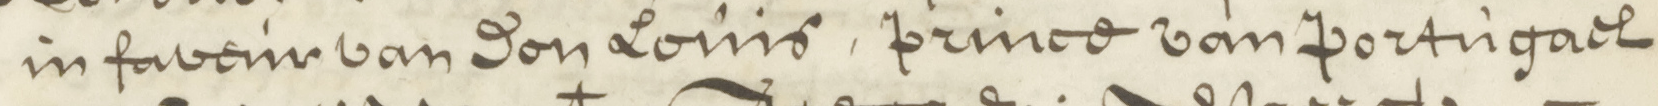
in faveur van Don Louis, prince van portugael
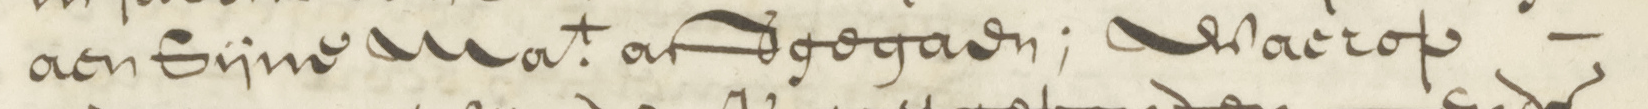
aen Sijne Mat. affgegaen; Waerop —
